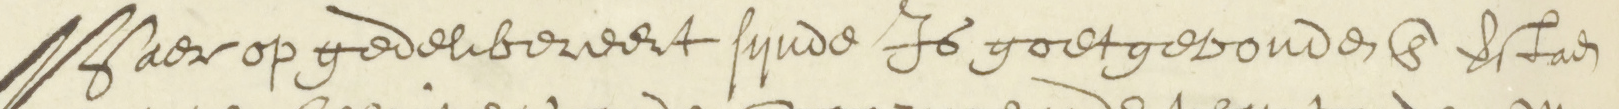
Waer op gedelibereert synde Is goetgevonden & vstaen
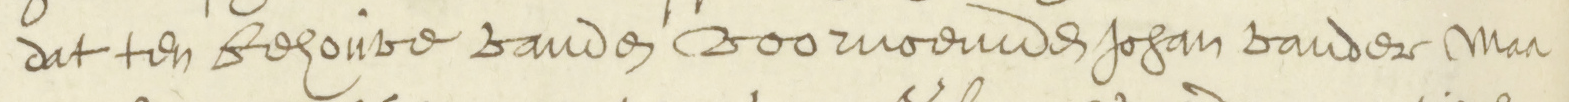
dat ten behouve vanden voornoemden Johan vander Maa
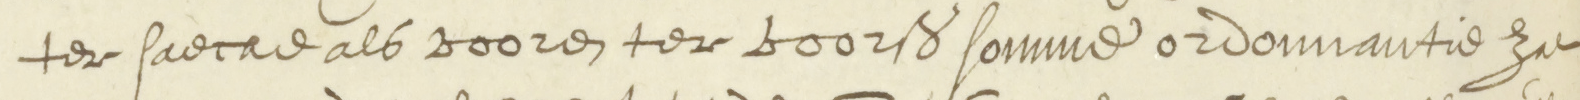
ter saecke als vooren ter voors somme ordonnantie zal
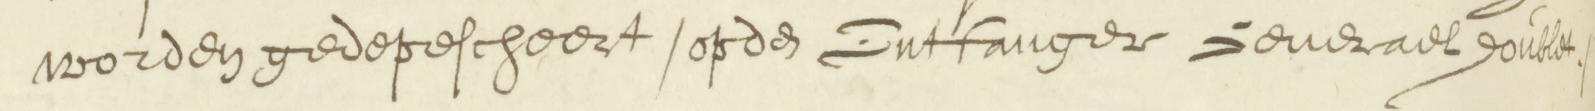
worden gedepescheert, opden Ontfanger Generael Doublet.
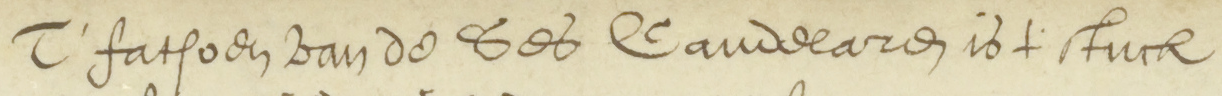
T‛fatsoen vande ses Candelaren is t‛stuck
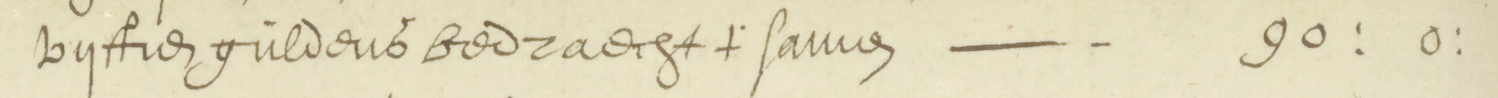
vijftien guldens bedraecht t‛samen — - 90:0:
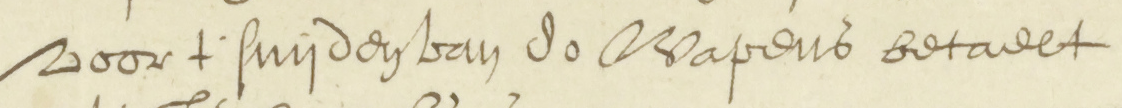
voor t‛snyden van 80 Wapens betaelt
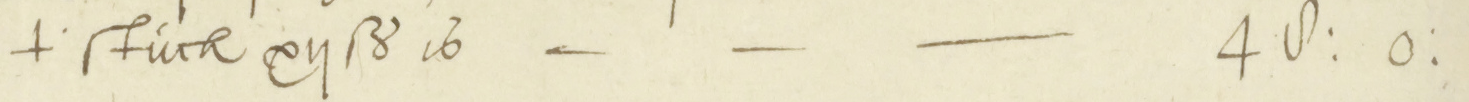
t· stuck xii s is — — — 48: 0:
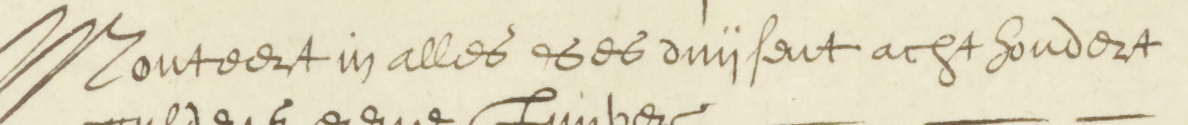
Monteert in alles ses duijsent achthondert
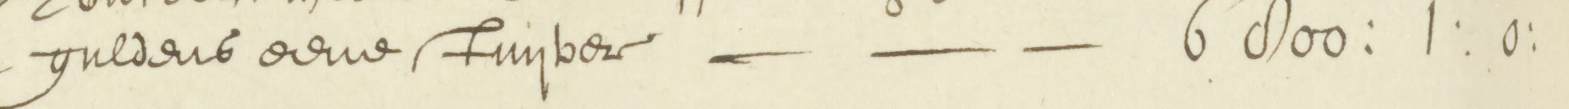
guldens eene stuyver — — — 6800:1:0:
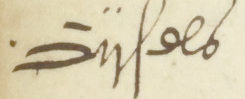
Gijsels
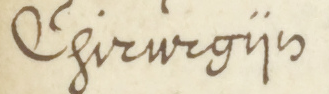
Chirurgijn
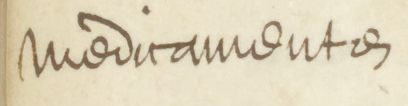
medicamenten
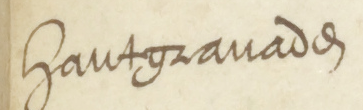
hantgranaden
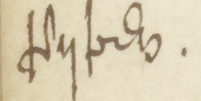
Pypen.
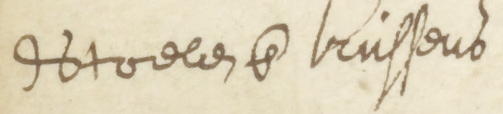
Stoelen & Kussens
